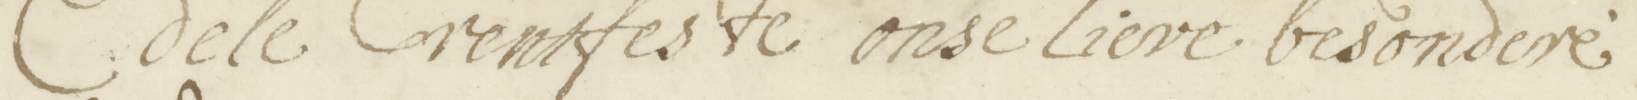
Edele Erentfeste onse lieve besondere,
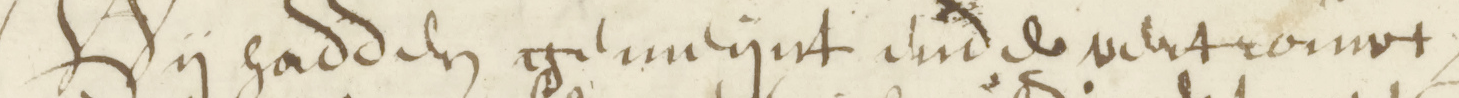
Wij hadden gemeijnt ende vertrouwt
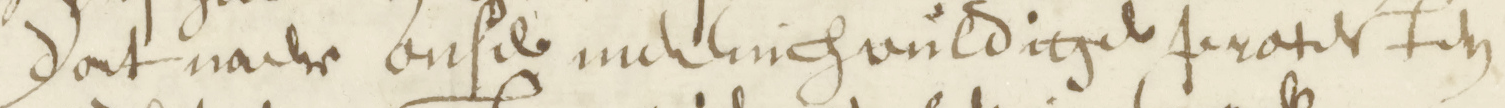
dat naer onse meenichvuldige protesten
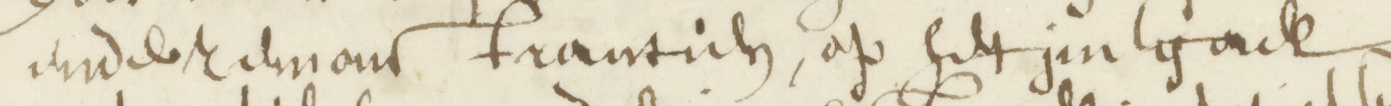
ende remonstrantien, op het inegael
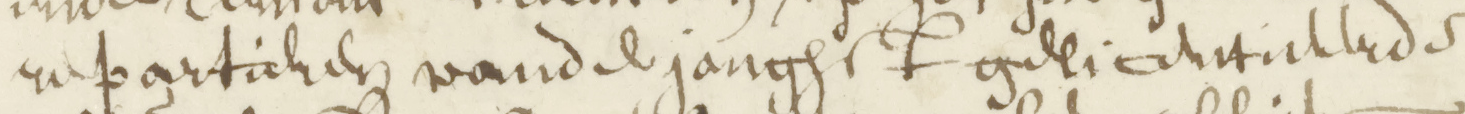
repartieren vande jonghst gelicentieerde
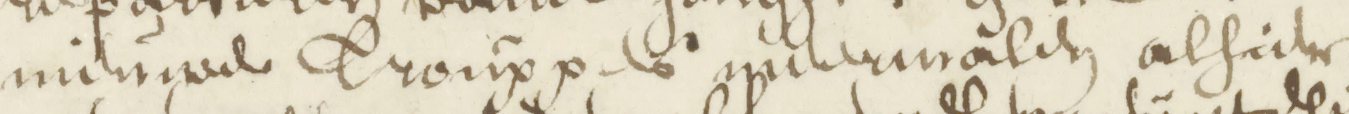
nieuwe Trouppes meermalen alhier
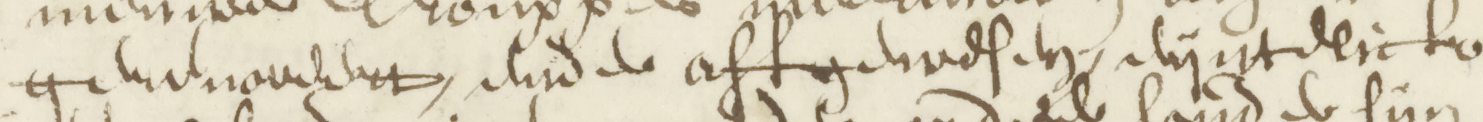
gerenoveert, ende affgewesen, eijntelick
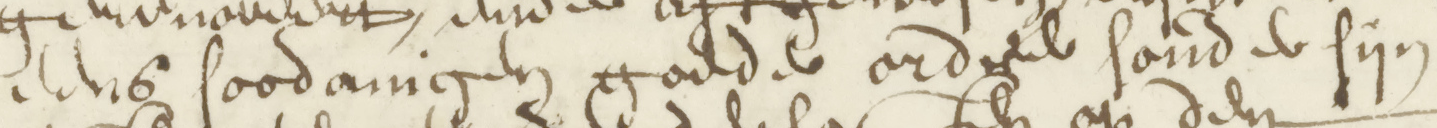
eens soodanigen goede ordre soude sijn
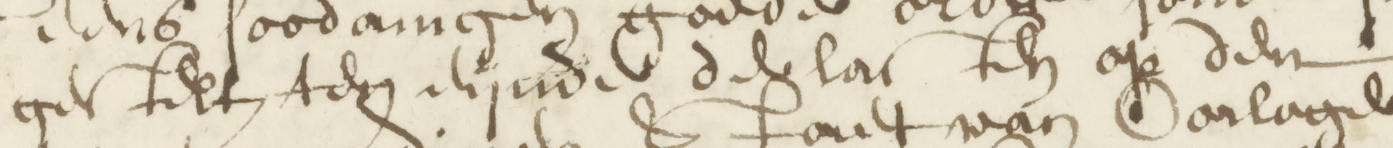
gestelt, ten eijnde de lasten op den
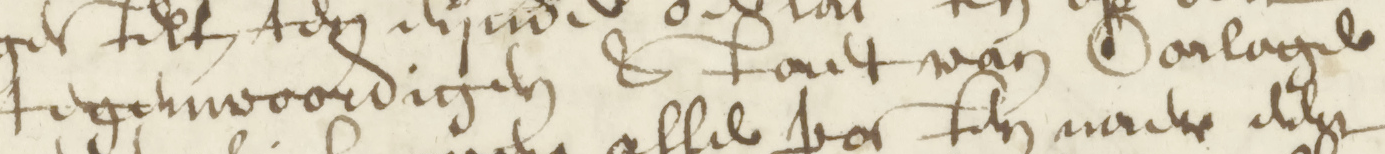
tegenwoordigen Staet van Oorloge
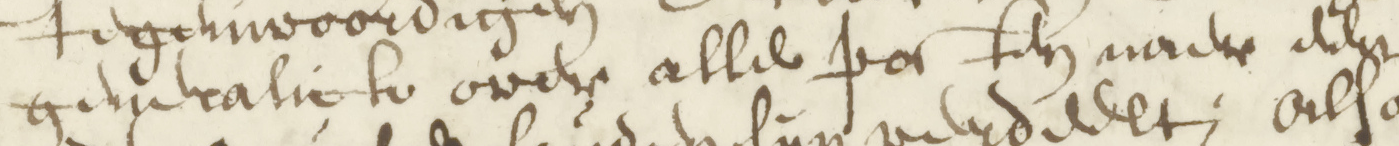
generalick over alle posten naer een
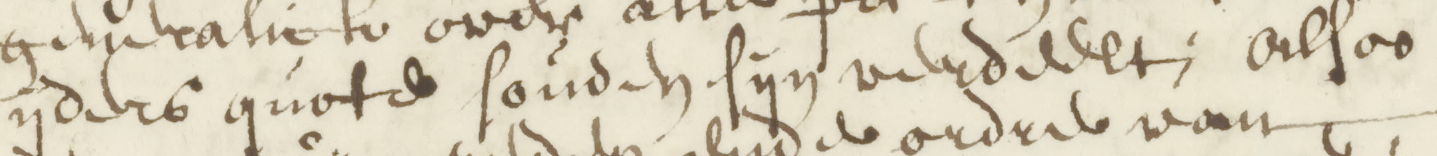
ijders quote souden sijn verdeelt; alsoo
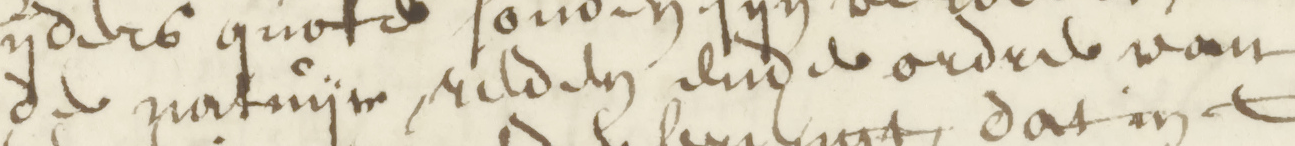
de natuijr, reden ende ordre van
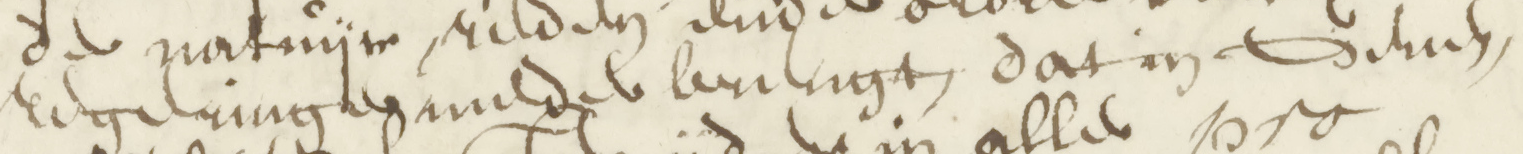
regeringe mede brengt, dat in Gene„
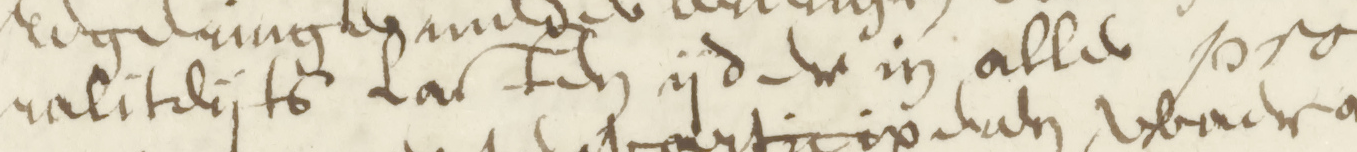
raliteijts lasten ijder in alle pro
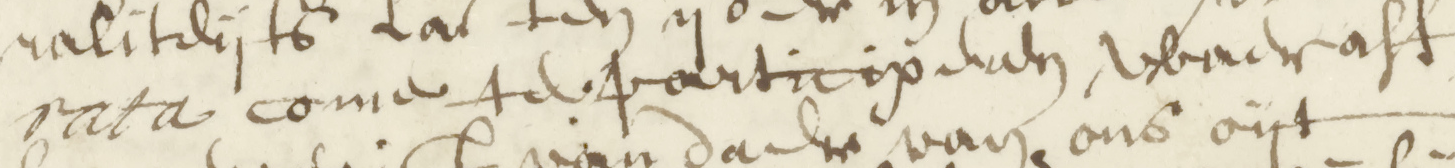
rata come te participeren, waeraff,
